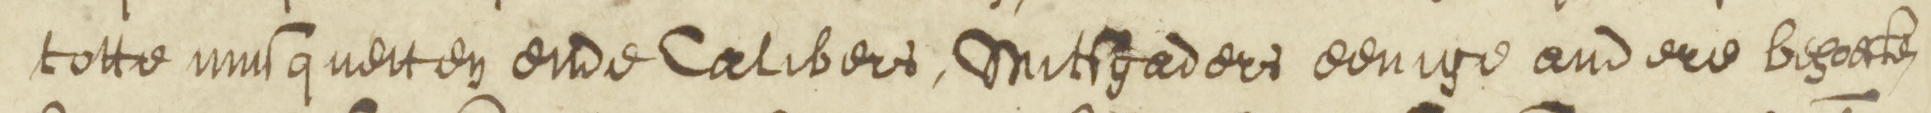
totte musquetten ende Calibers, Mitsgaders eenige andere behoeften
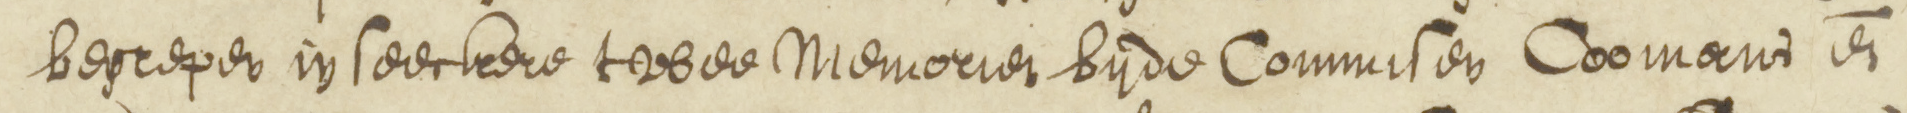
begrepen in seeckere twee Memorien byde Commisen Coomans en
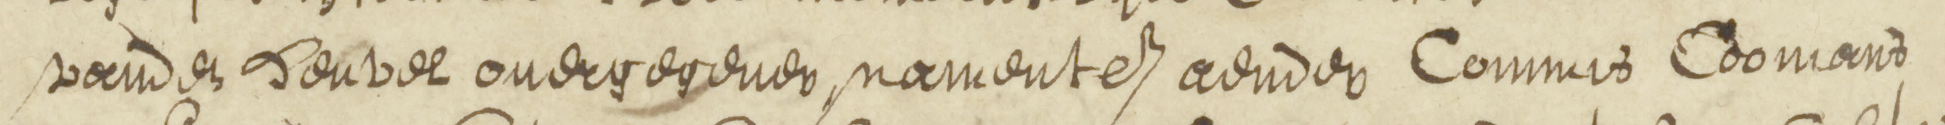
vanden Heuvel ouergegeuen, namentl aenden Commis Coomans
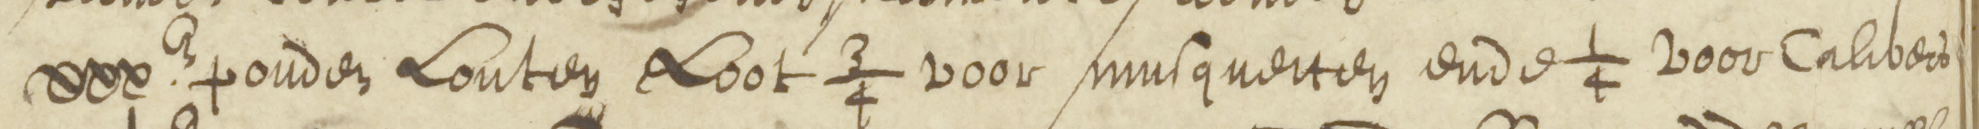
xxxm. ponden Lonten Loot ¾ voor musquetten ende ¼ voor Calibers
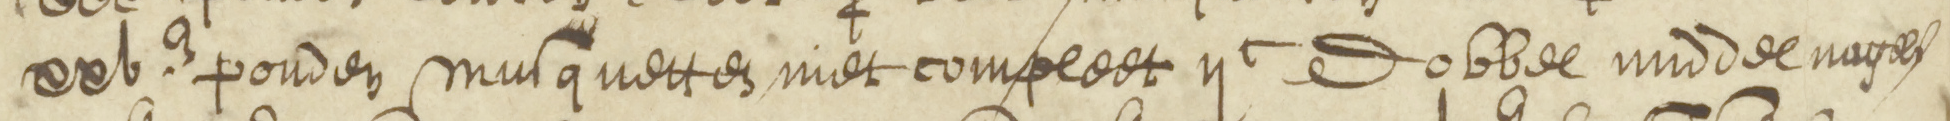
xxvm. ponden musquetten niet compleet ijc Dobbel middel nagels
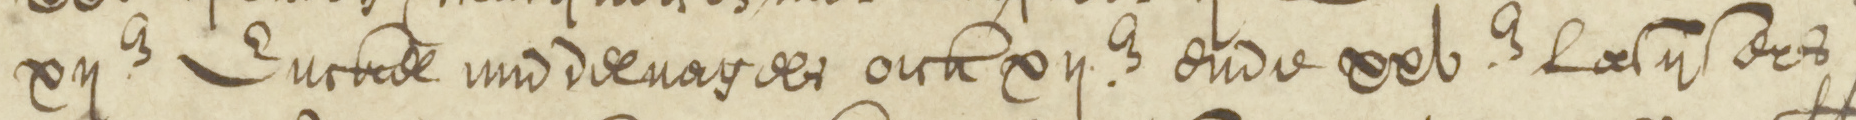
xijm. Enckel middelnagels oick xijm. ende xxvm. lasysers
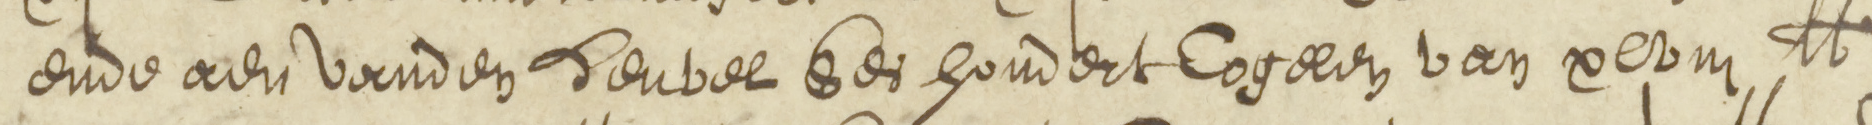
ende aen vanden Heuvel Ses hondert Cogelen van xlviij lb
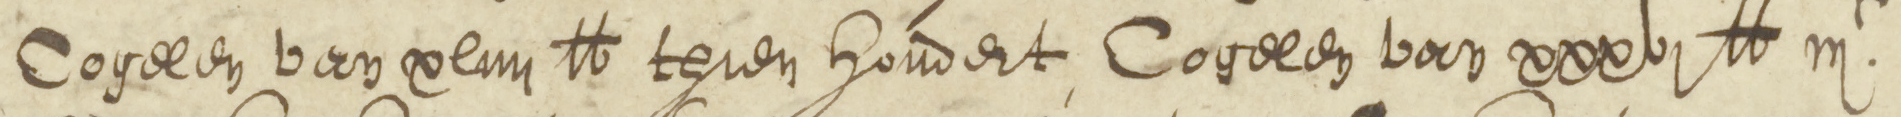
Cogelen van xliiij lb thien hondert, Cogelen van xxxvj lb iijc.
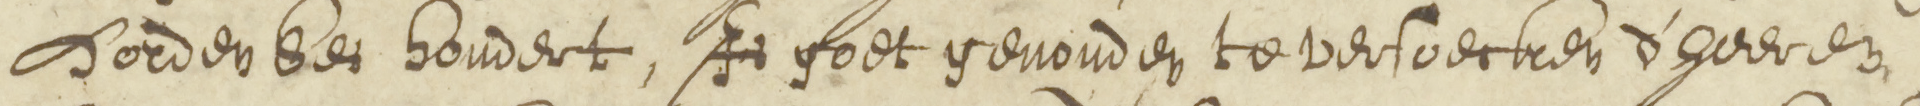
horden Ses hondert. Is goet geuonden te versoecken d'heeren
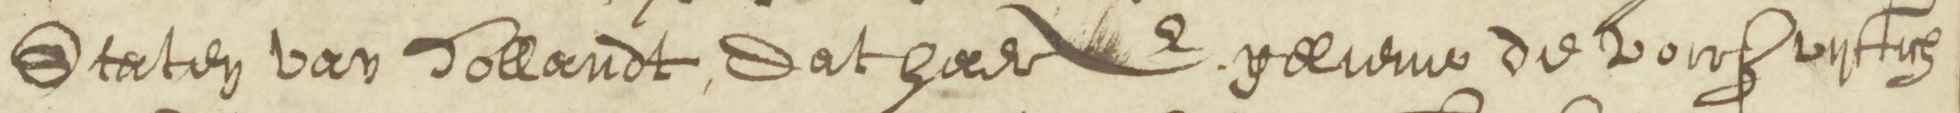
Staten van Hollandt, dat haer E. gelieue de voirs vyftich
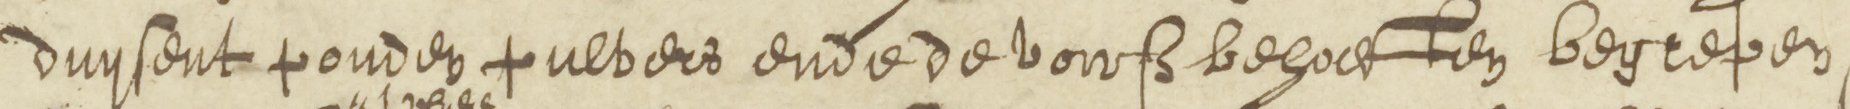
duysent ponden pulvers ende de voirs behoeften begrepen
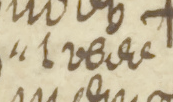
,,twee
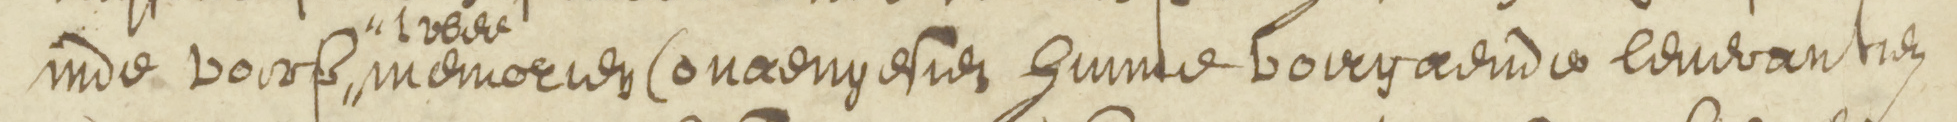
inde voirs,,memorien (onaengesien hunnen voirgaende leuerantien
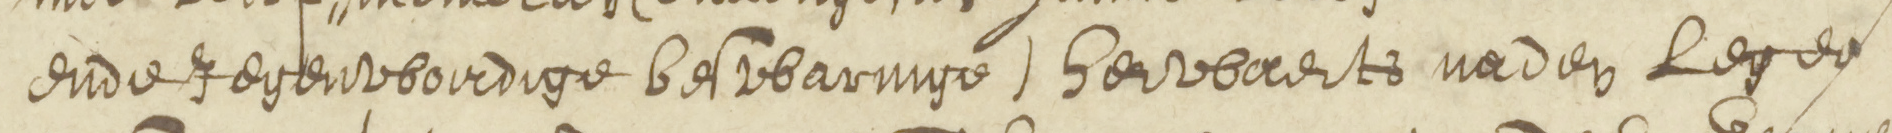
ende Jegenwoirdige beswaringe) herwaerts naden Leger
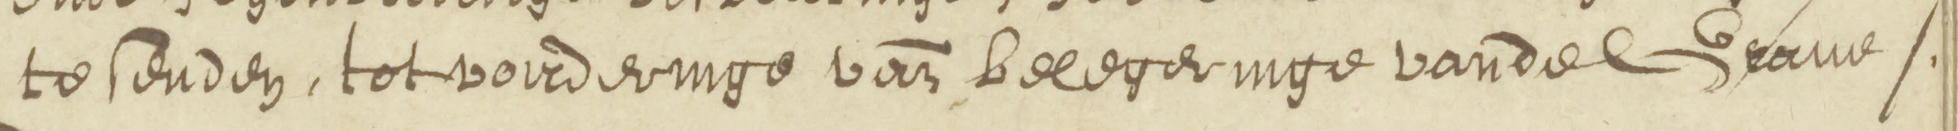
te senden, tot voirderinge van belegeringe vande Graue.
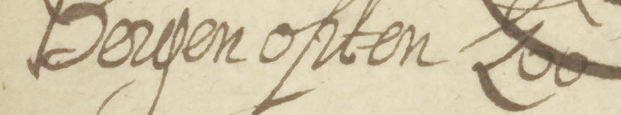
Bergen opten Zoom
